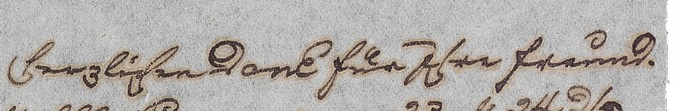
Herzlichen Dank für Ihre freund-
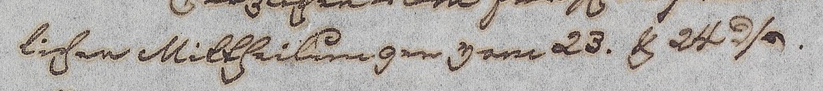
lichen Mittheilungen vom 23. & 24 dss.
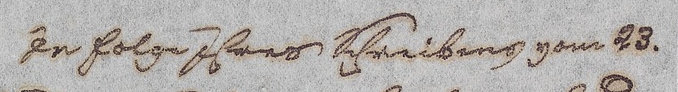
In Folge Ihres Schreibens vom 23.
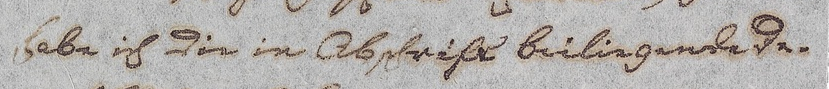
habe ich die in Abschrift beiliegende De-
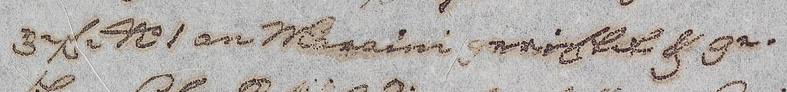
pesche No 1 an Maraini gerichtet & ge-
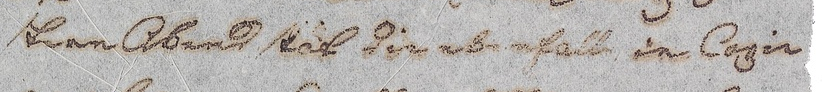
stern Abend spät die ebenfalls in Copie
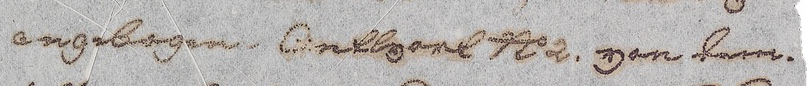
angebogene Antwort No 2 von dem-
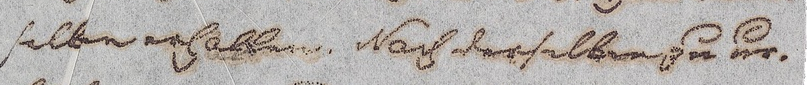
selben erhalten. Nach derselben zu ur-
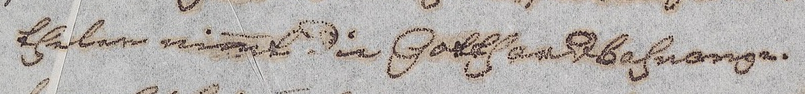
theilen nimmt die Gotthardbahnange-
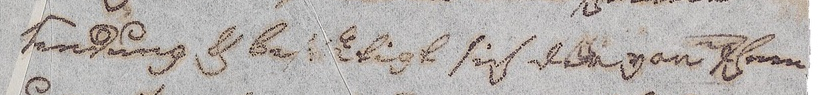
Wendung & bestätigt sich der von Ihnen
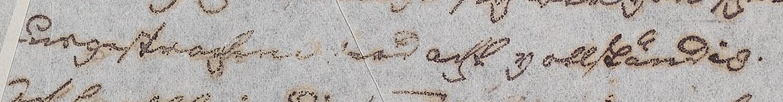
ausgesprochene Verdacht vollständig.
